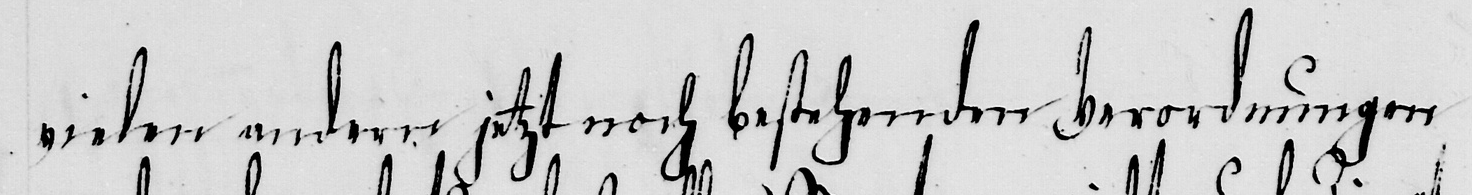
vielen andern jetzt noch bestehenden Verordnungen
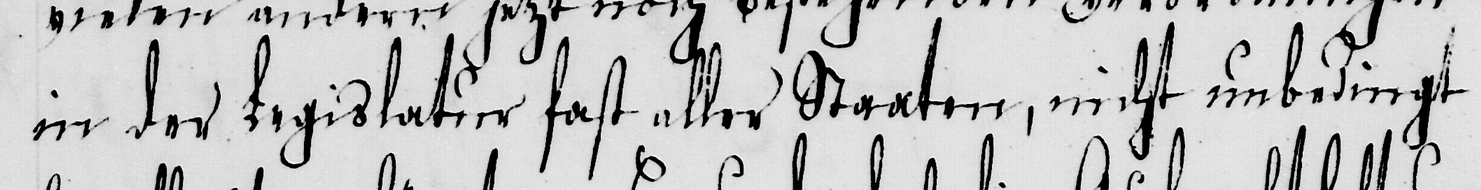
in der Legislatur fast aller Staaten, nicht unbedingt
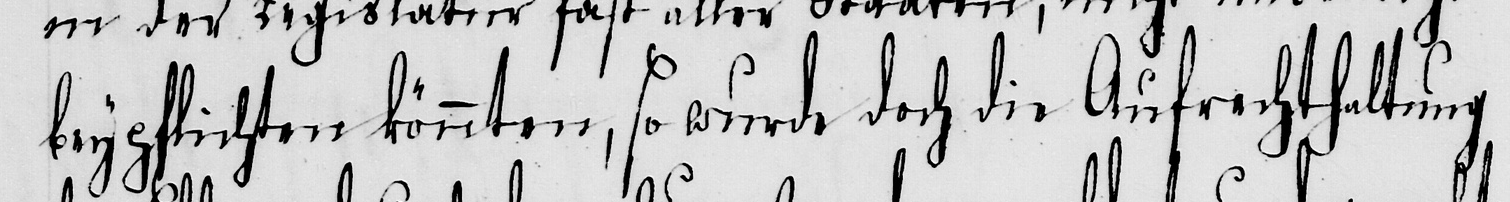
beypflichten könnten, so wurde doch die Aufrechthaltung
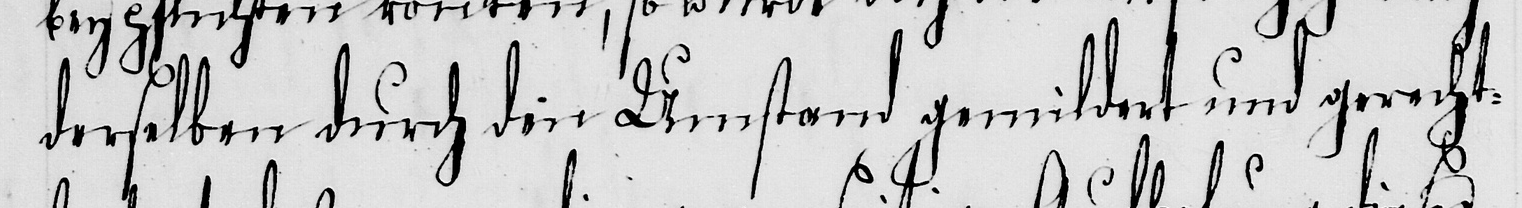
derselben durch den Umstand gemildert und gerech¬
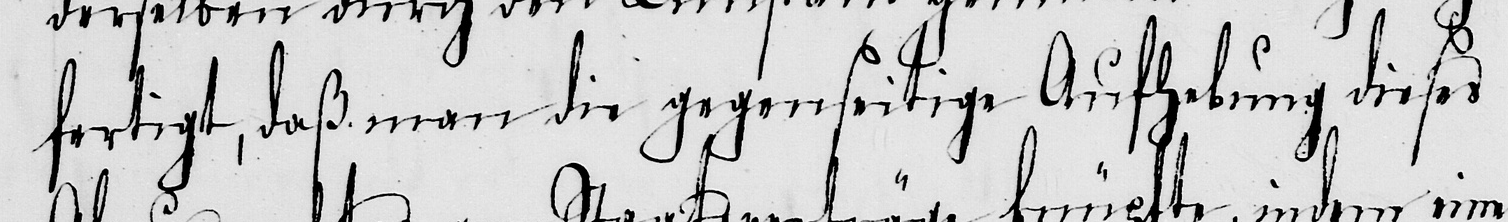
tfertigt, daß man die gegenseitige Aufhebung dieses
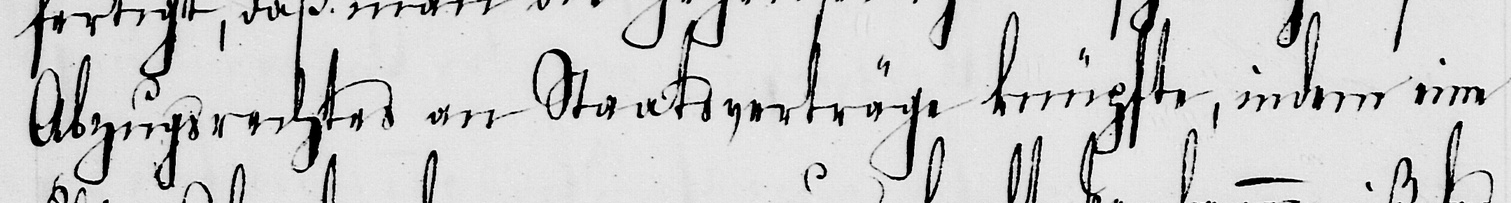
Abzugsrechtes an Staatsverträge knüpfte, indem eine
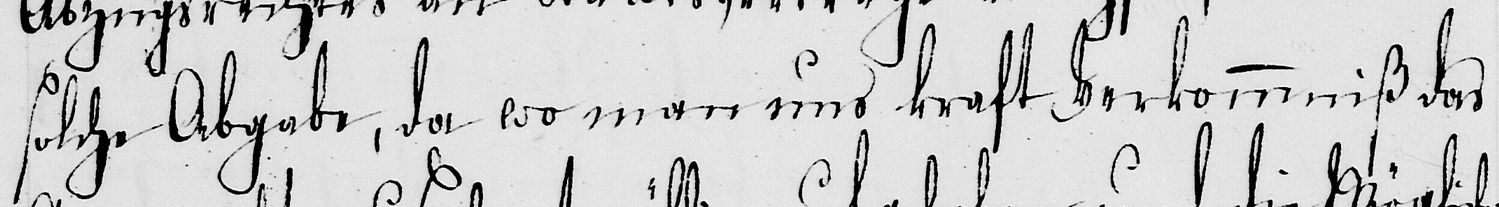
solche Abgabe, da wo man uns kraft Verkommniß das
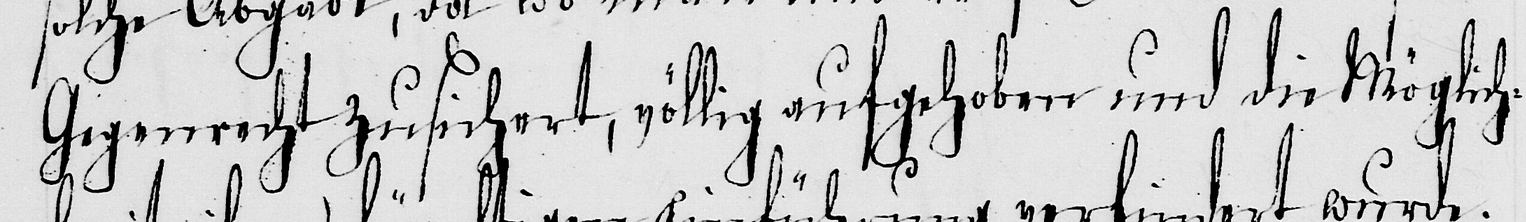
Gegenrecht zusichert, völlig aufgehoben und die Mögli¬
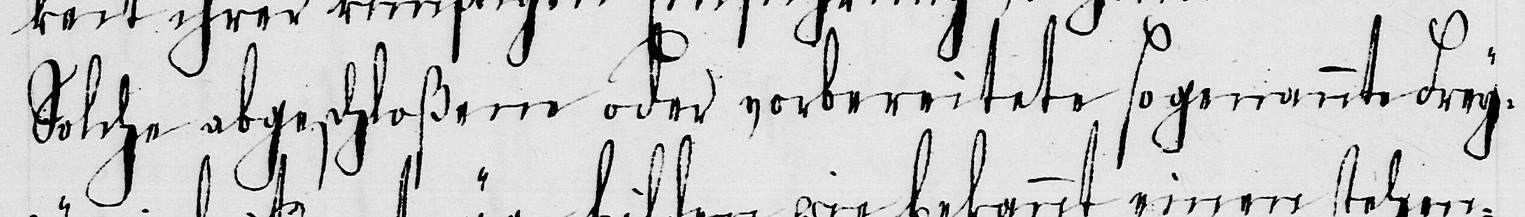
Solche abgeschloßene oder vorbereitete sogenannte Frey¬
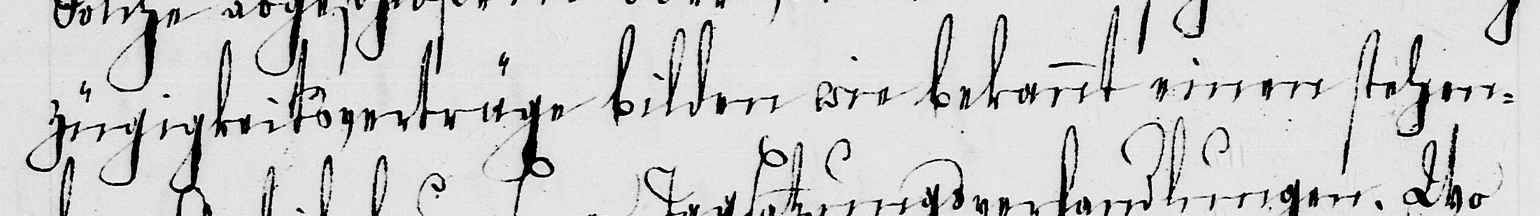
zügigkeitsverträge bilden wie bekannt einen stehen¬
